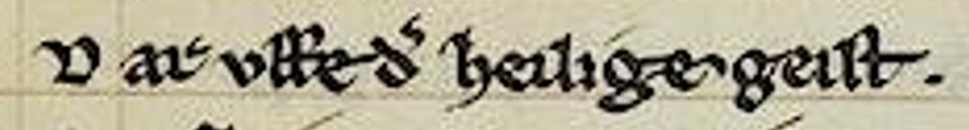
Dar vffe d(er) heilige geiſt.
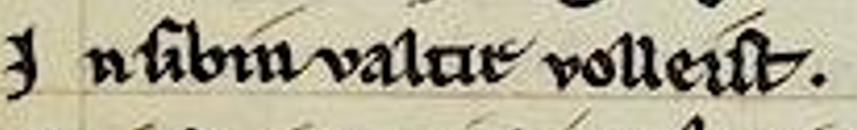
In ſibin valtir volleiſt.
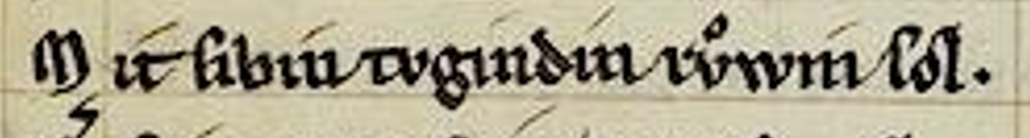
Mit ſibin tugindin rv°owin ſol.
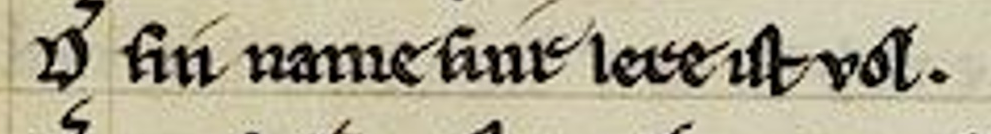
D(er) ſin name ſinr lere iſt vol.
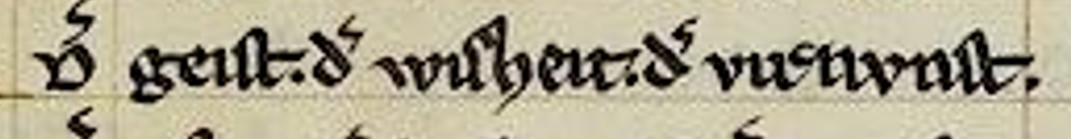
D(er) geiſt. d(er) wiſheit. d(er) virnvnſt.
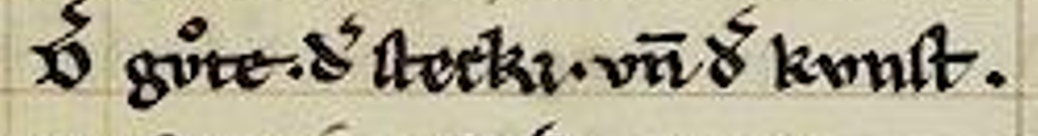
D(er) gv°ote. d(er) ſterki. vn(d) d(er) kvnſt.
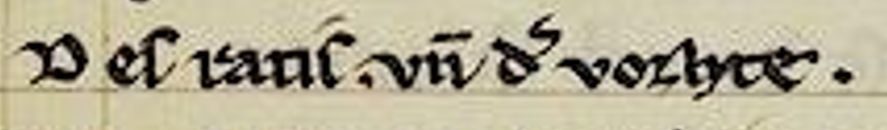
Deſ ratiſ. vn(d) d(er) vorhte.
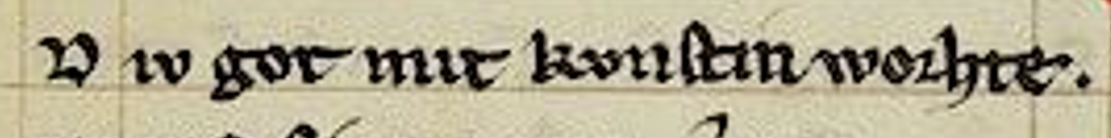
Div got mit kvnſtin worhte.
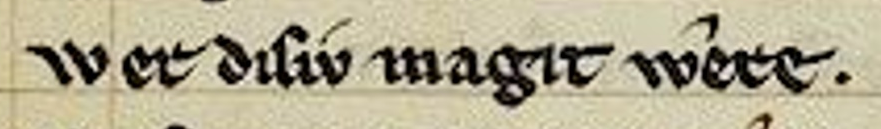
Wer diſiv magit were.
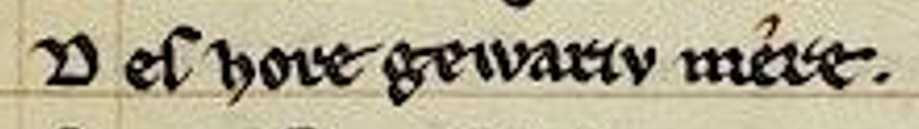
Deſ hore gewariv mere.
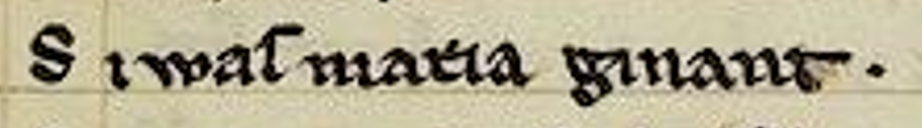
Si waſ maria ginant.
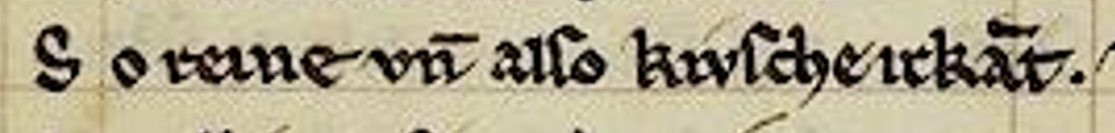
So reine vn(d) alſo kivſche irka(n)t.
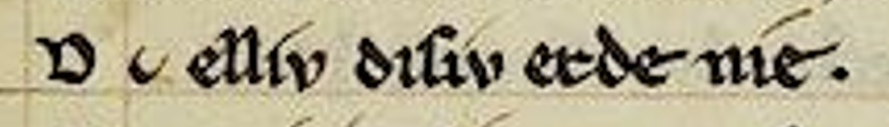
D(az) elliv diſiv erde nie.
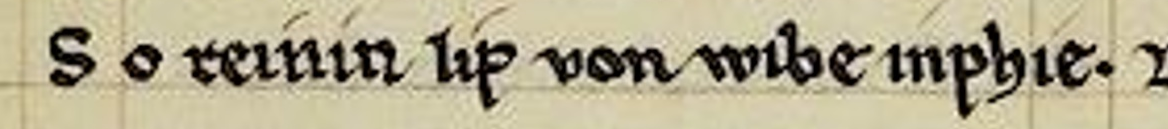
So reinin lip von wibe inphie.
